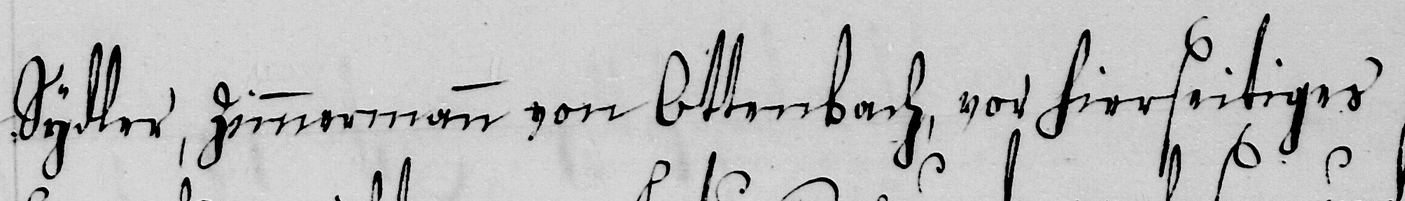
Sydler, Zimmermann von Ottenbach, vor hierseitiges
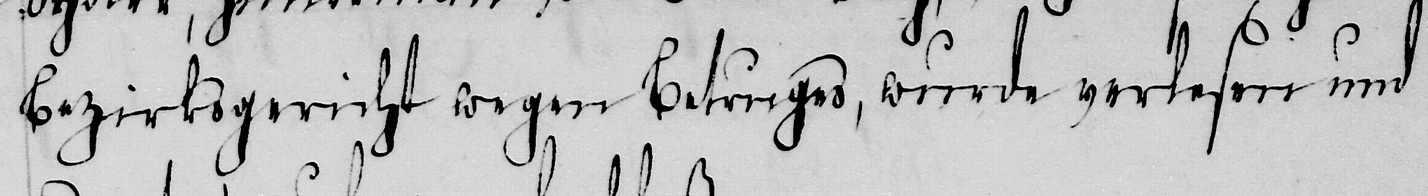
Bezirksgericht wegen Betruges, wurde verlesen und
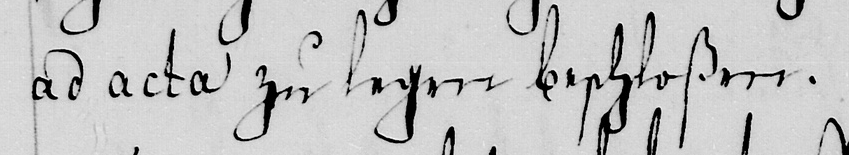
ad acta zu legen beschloßen.
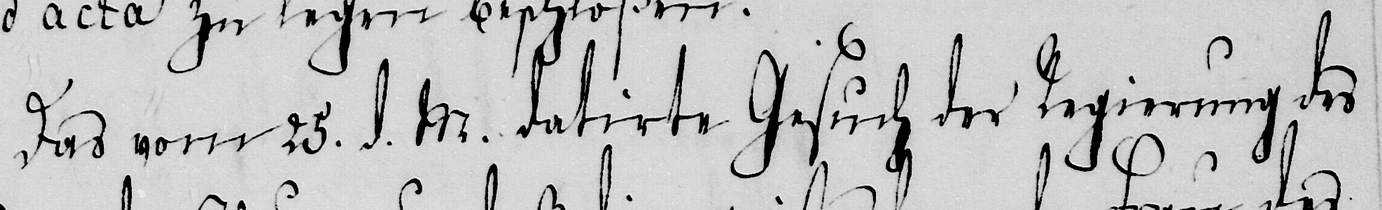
Das vom 25. d. M. datirte Gesuch der Regierung des
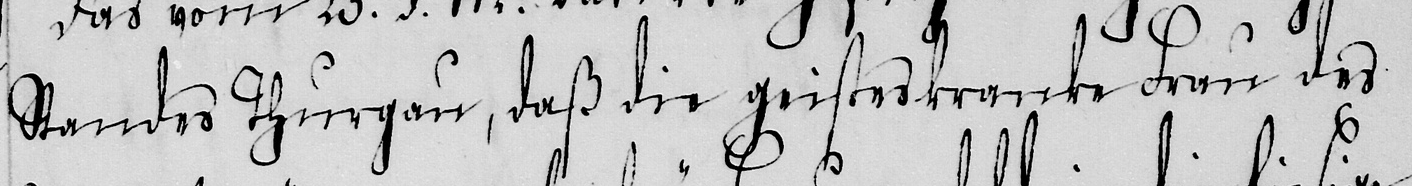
Standes Thurgau, daß die geisteskranke Frau des
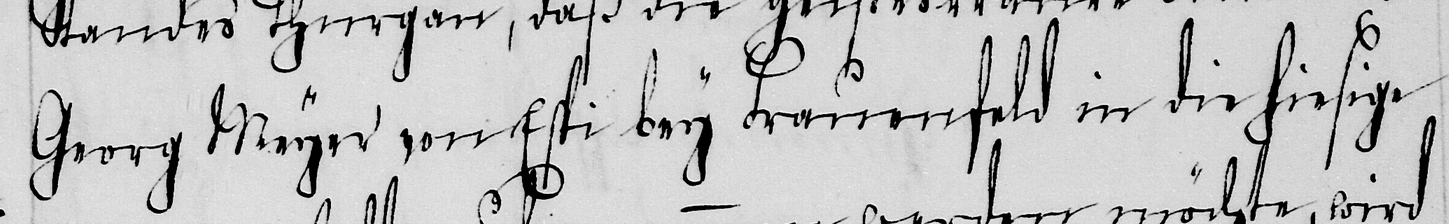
Georg Meyer von Espi bey Frauenfeld in die hiesige
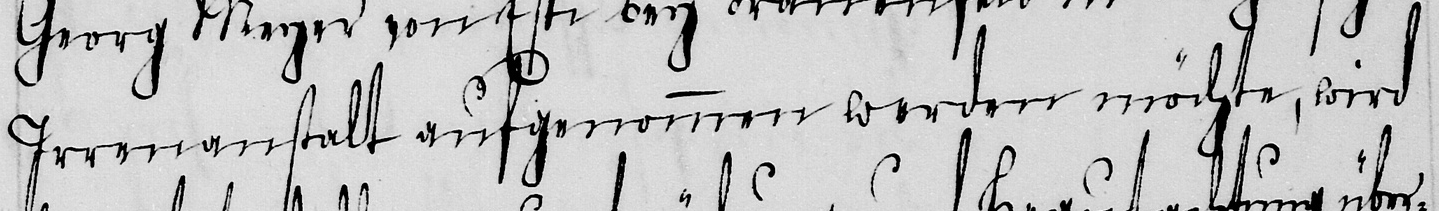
Irrenanstalt aufgenommen werden möchte, wird
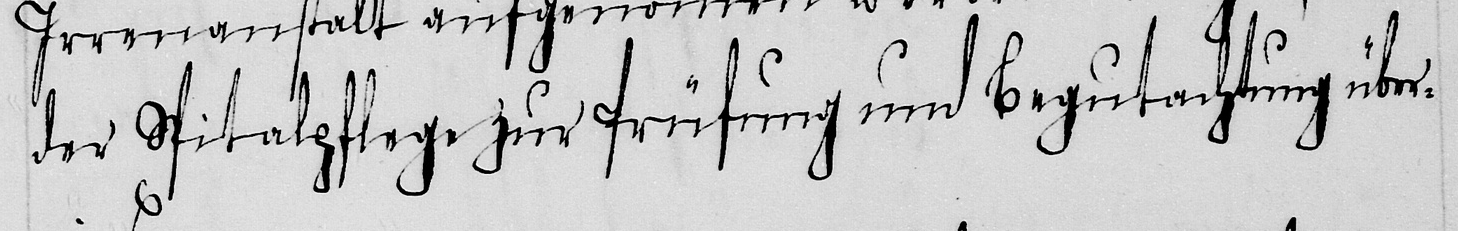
der Spitalpflege zur Prüfung und Begutachtung über¬
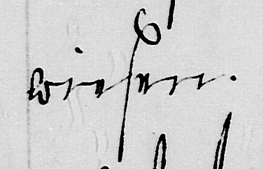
wiesen.
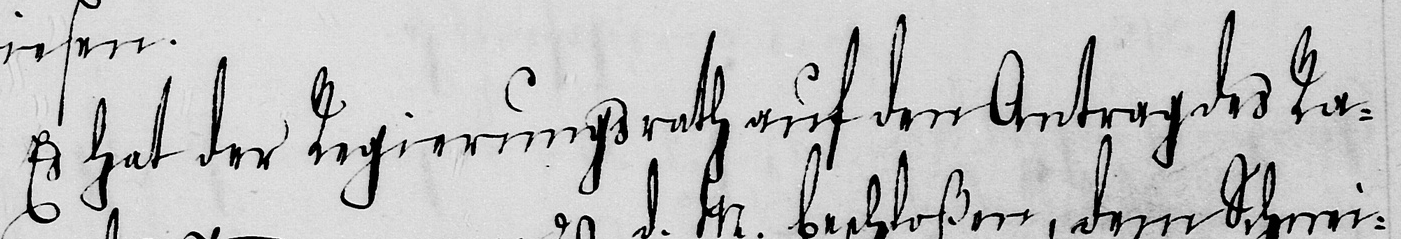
Es hat der Regierungsrath auf den Antrag des Ra¬
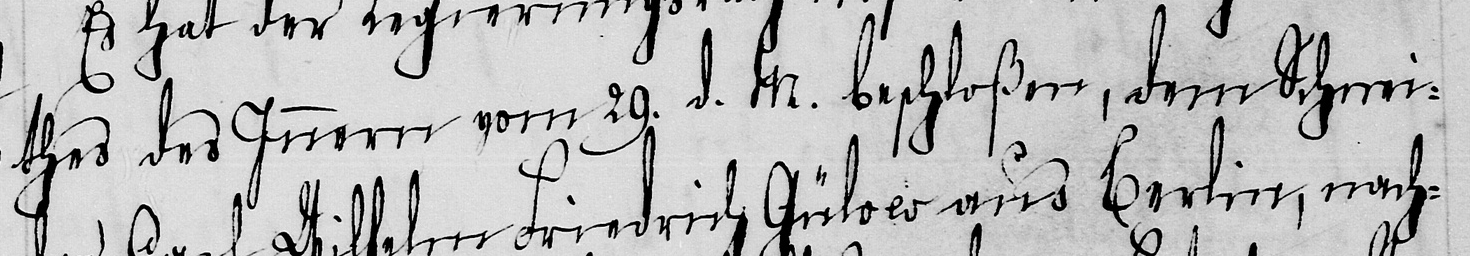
thes des Innern vom 29. d. M. beschloßen, dem Schnei¬
